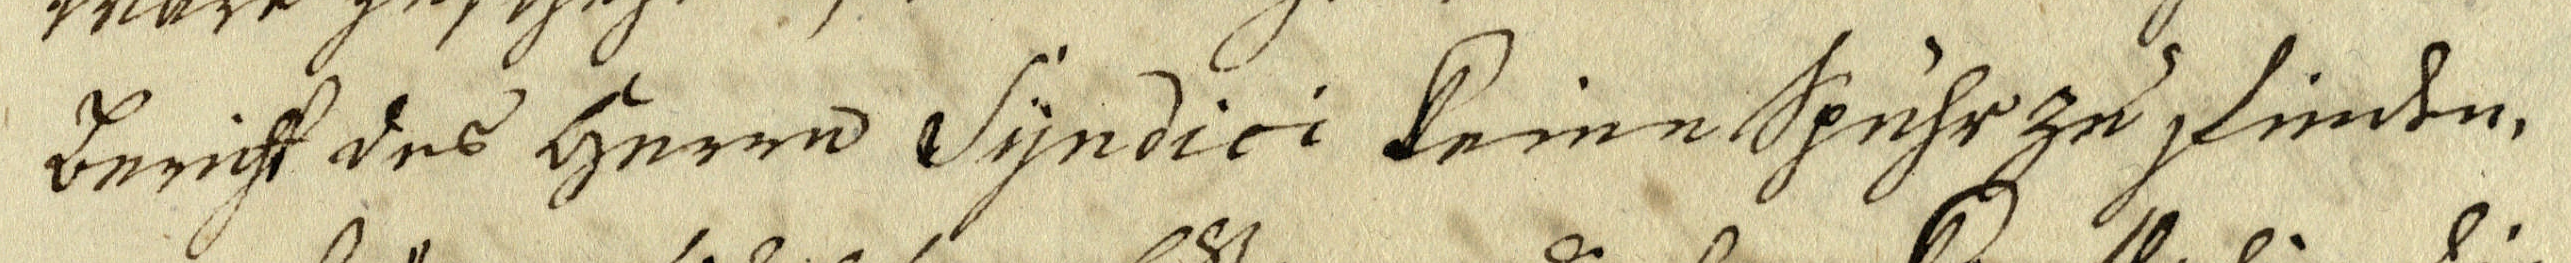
Bericht des Herrn Sÿndici keine Spuhr zu finden,
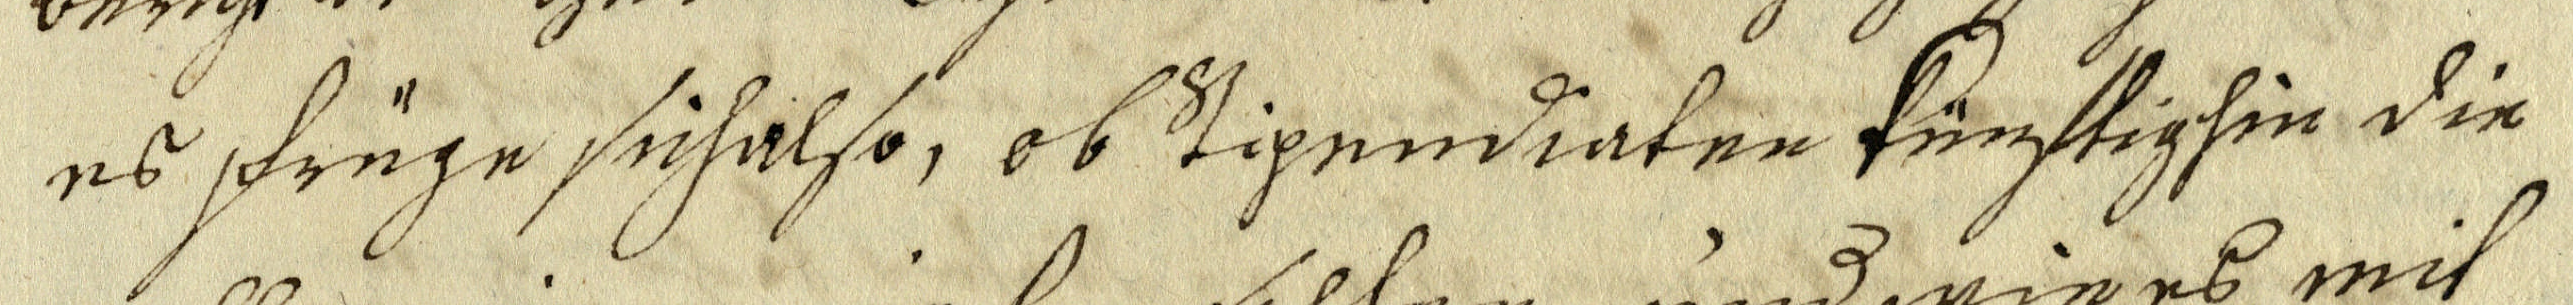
es früge sich also, ob Stipendiaten künftighin die
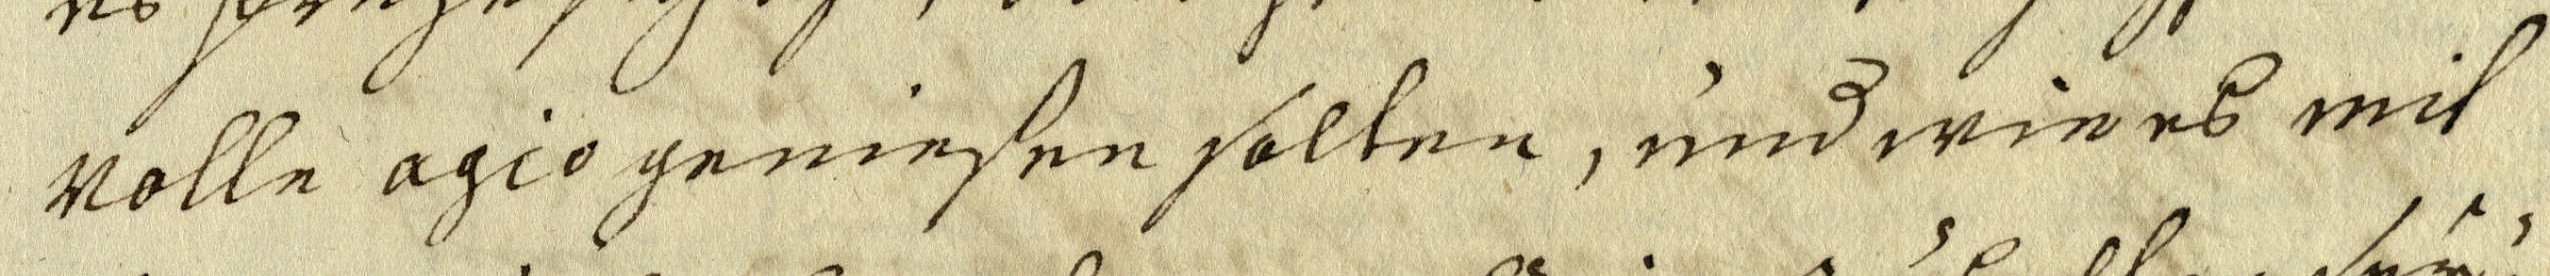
volle agio genießen solten, und wie es mit
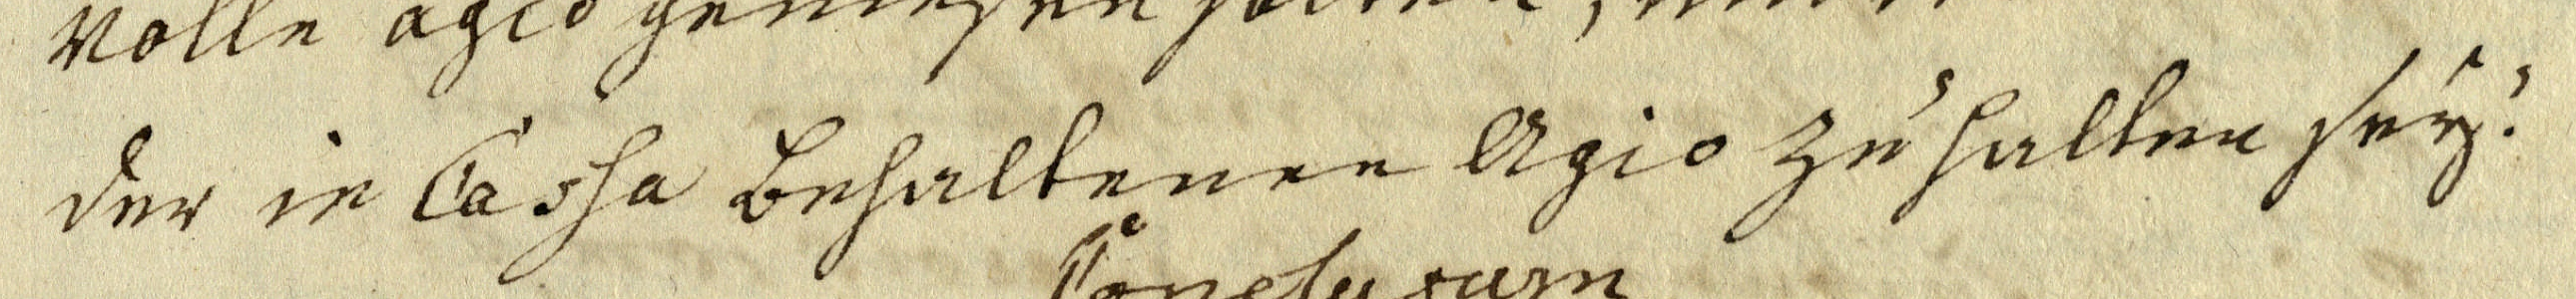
der in Cassa behaltenen Agio zu halten seÿ?
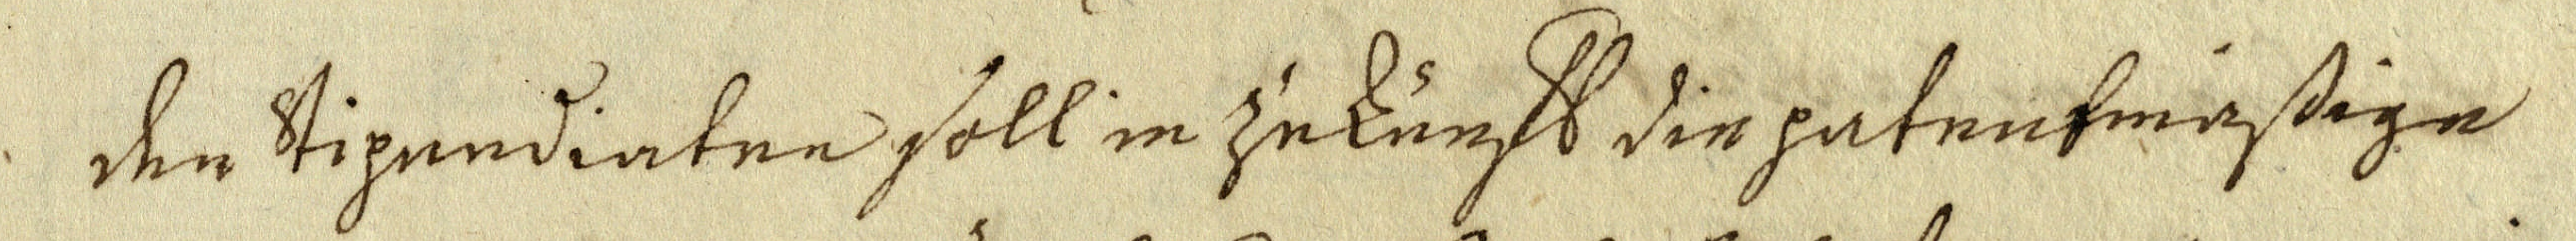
Den Stipendiaten soll in Zukunft die patentmäßige
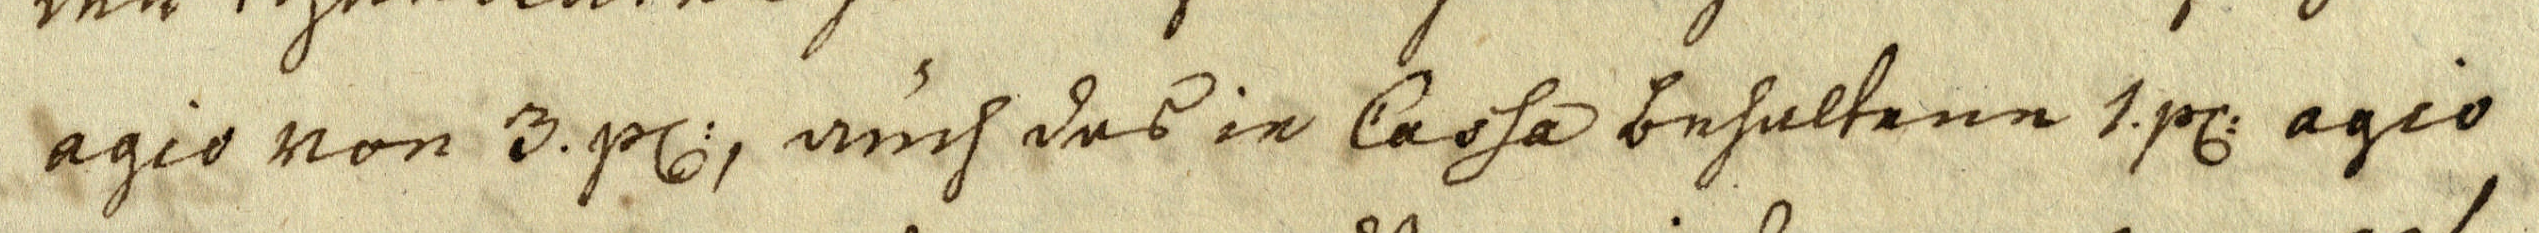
agio von 3 p., auch das in Cassa behaltene 1p. agio
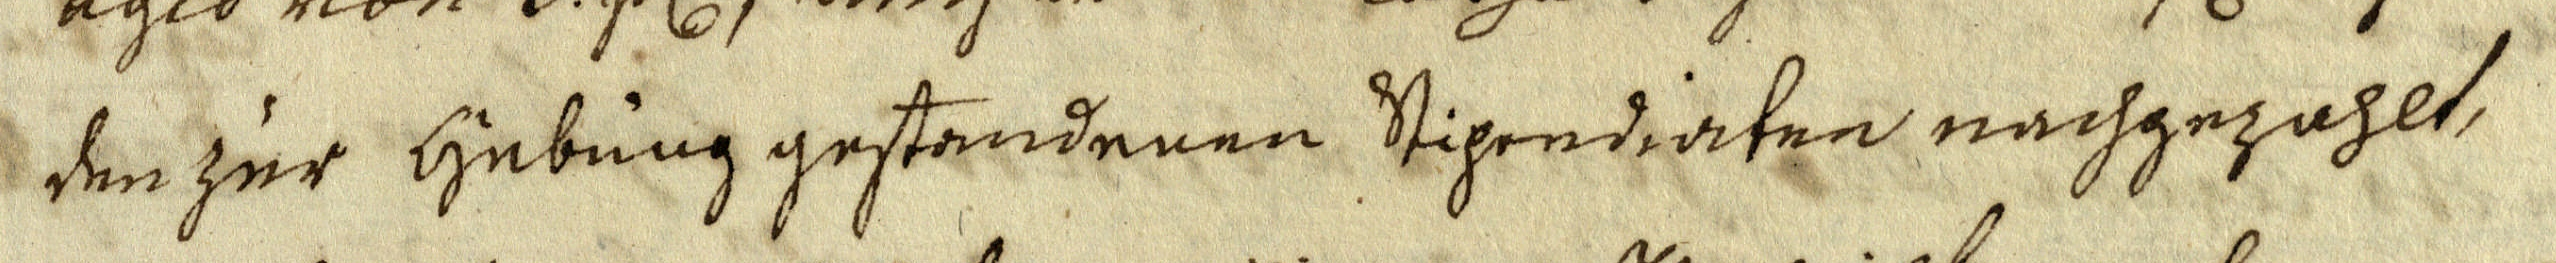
den zur Hebung gestandenen Stipendiaten nachgezahlt,
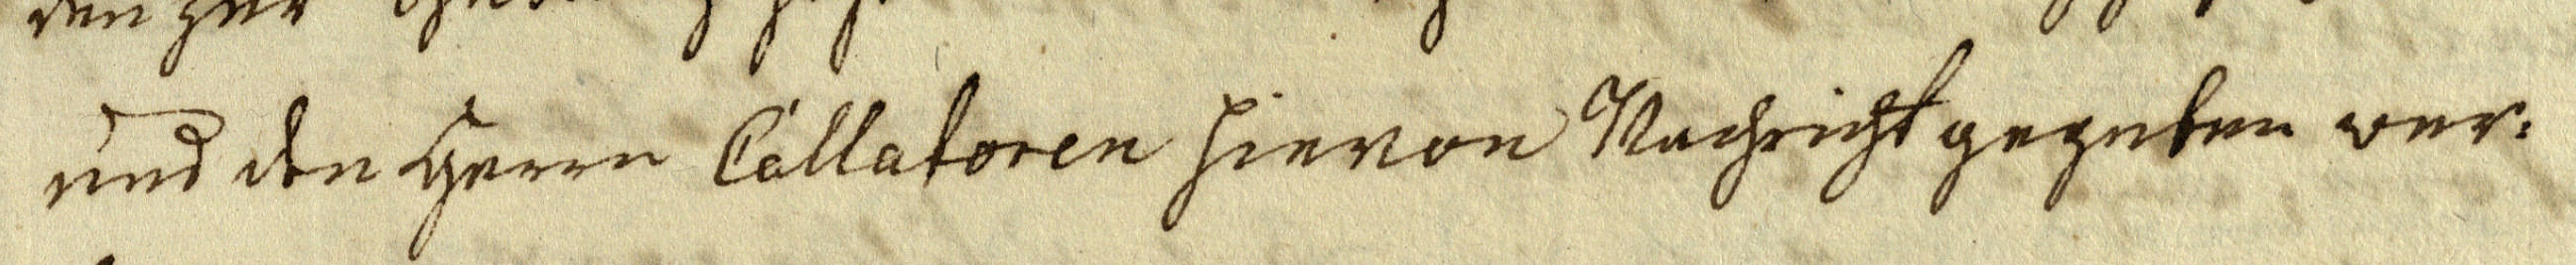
und den Herrn Collatoren hievon Nachricht gegeben wer¬
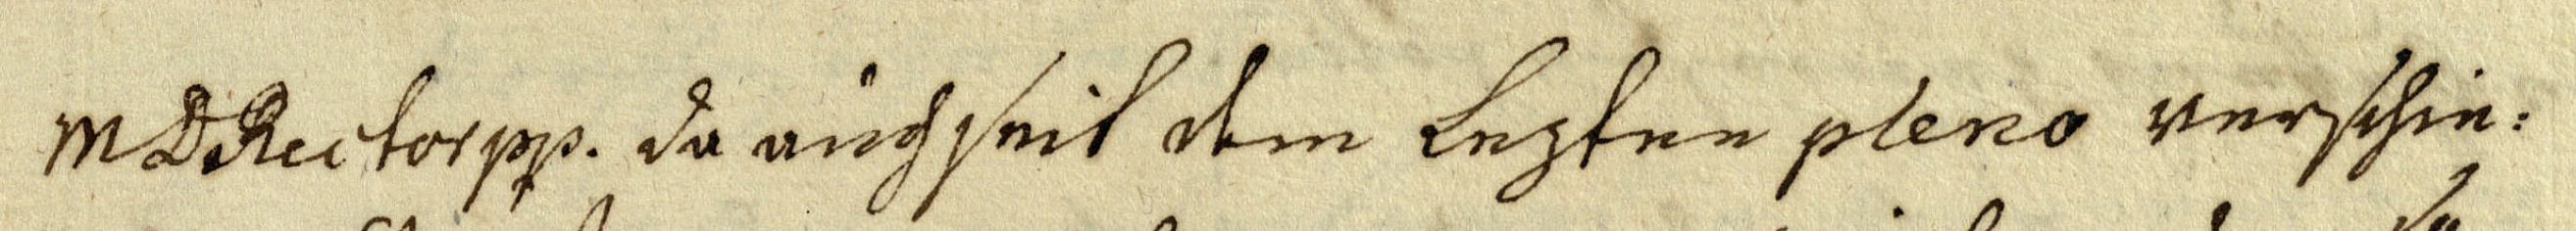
M. D. Rector pp. da auch seit dem lezten pleno verschie¬
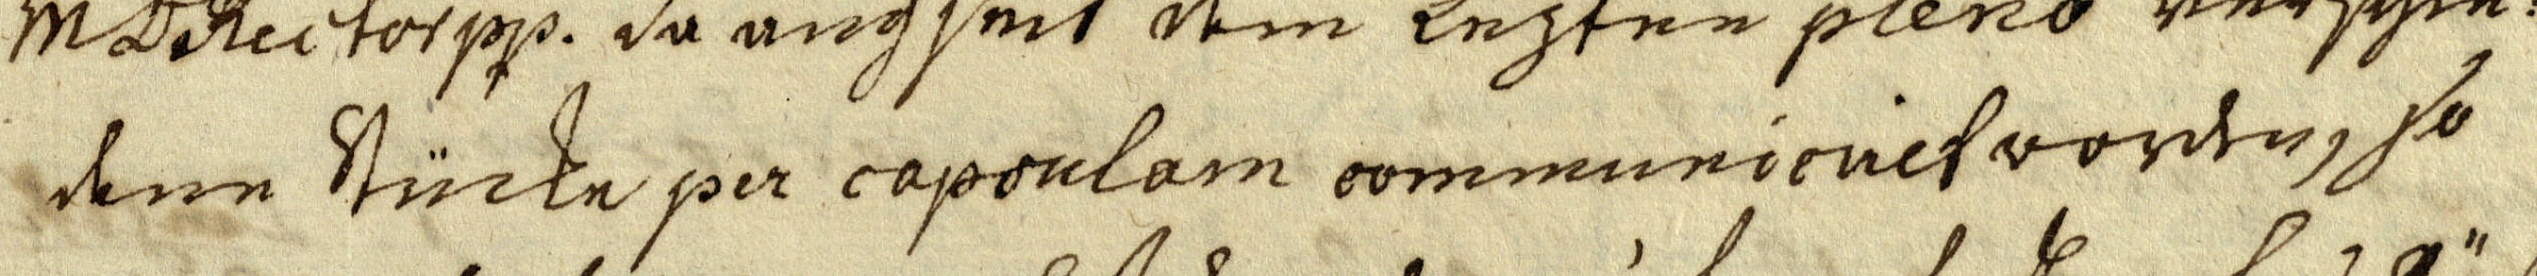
dene Stücke per capsulam communiciret worden, so
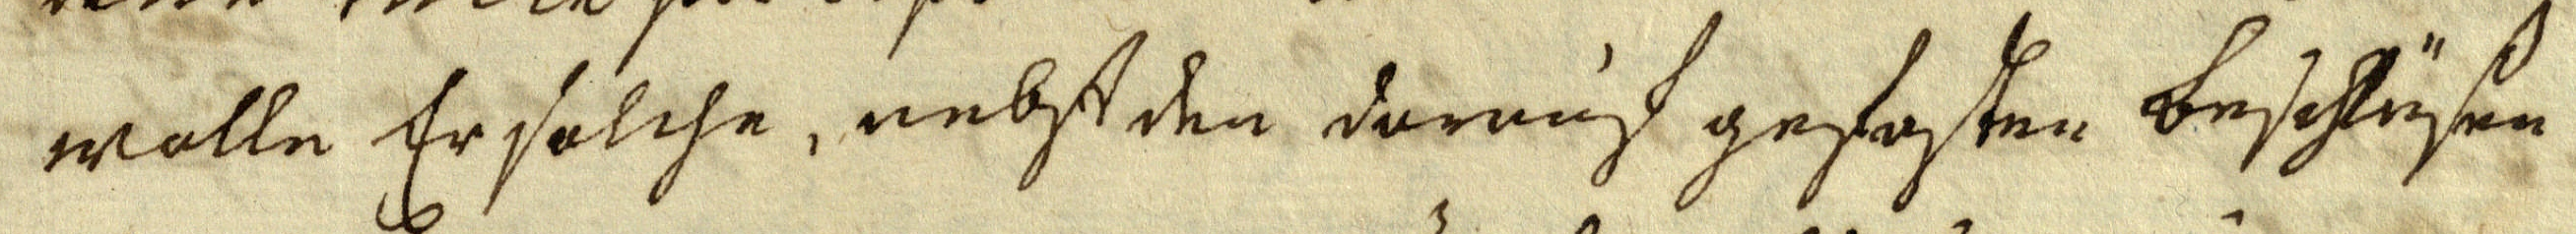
wolle Er solche, nebst den darauf gefasten Beschlüßen
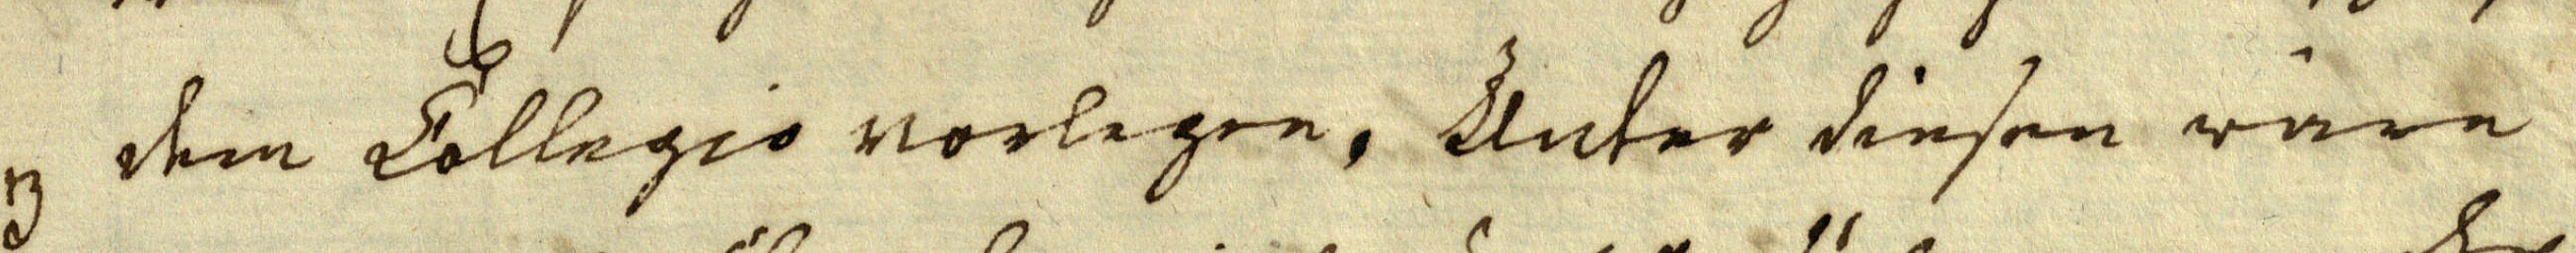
3 dem Collegio vorlegen. Unter diesen wäre
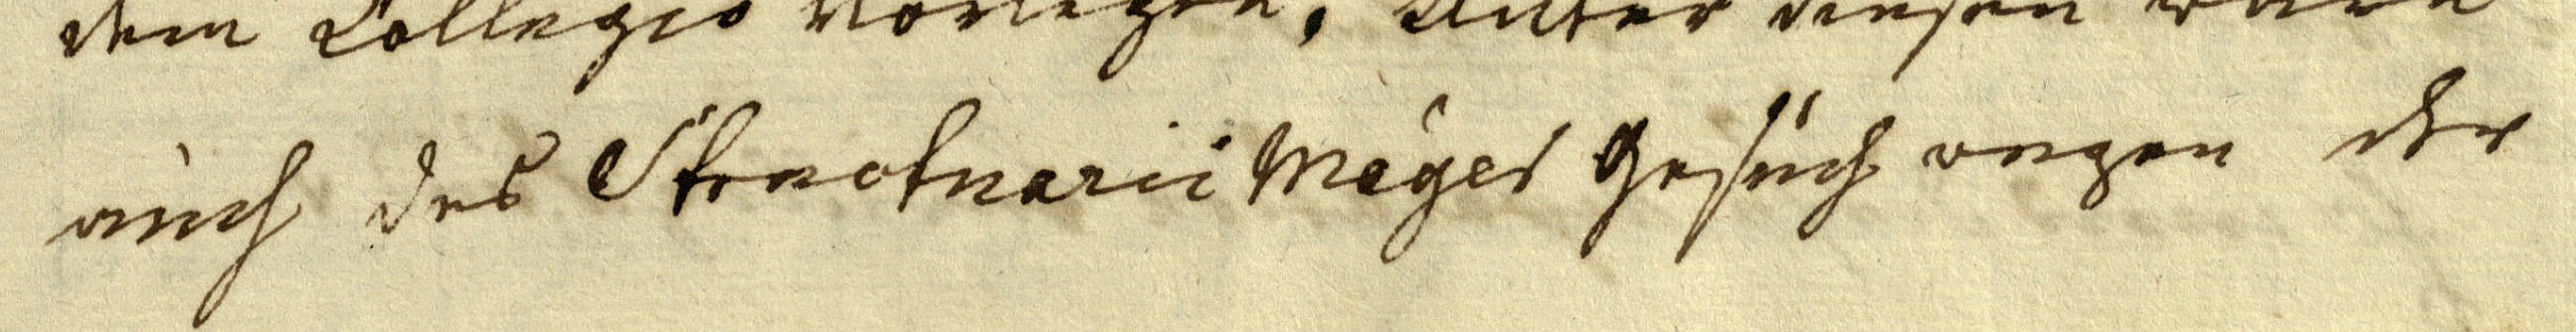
auch des Structuarii Maÿer Gesuch wegen der
